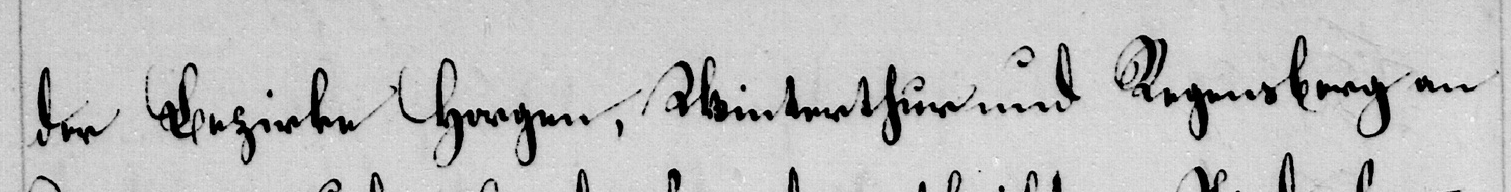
der Bezirke Horgen, Winterthur und Regensberg an
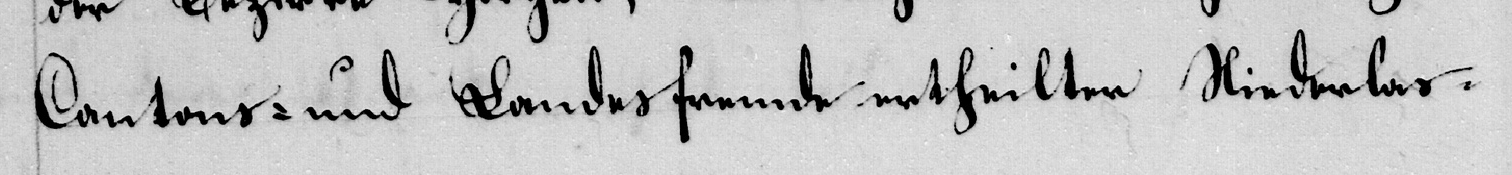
Cantons- und Landesfremde ertheilten Niederlaß¬
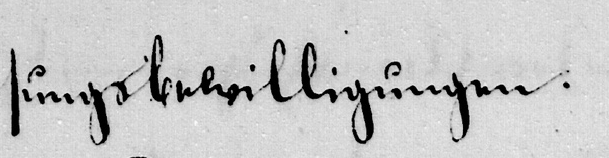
ungsbewilligungen.
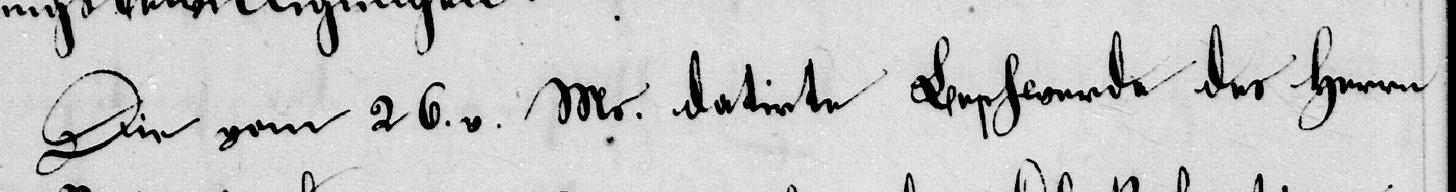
Die vom 26. v. Ms. datirte Beschwerde des Herrn
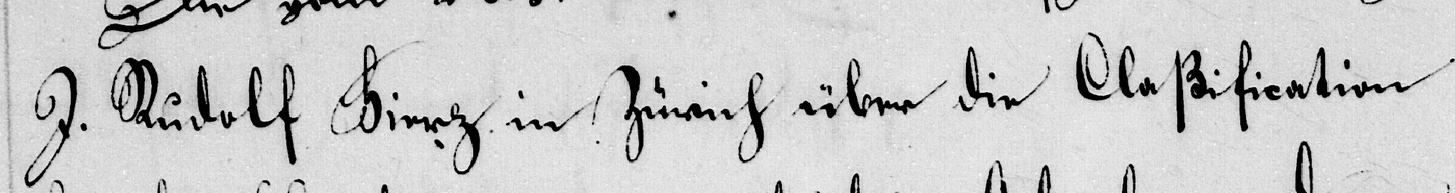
J. Rudolf Fierz in Zürich über die Claßification
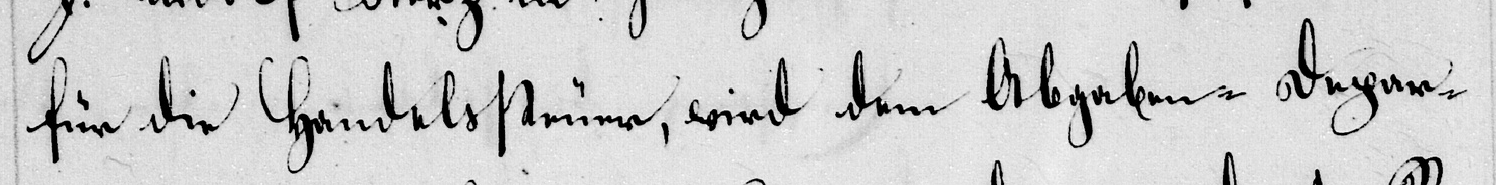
für die Handelssteuer, wird dem Abgaben-Depar¬
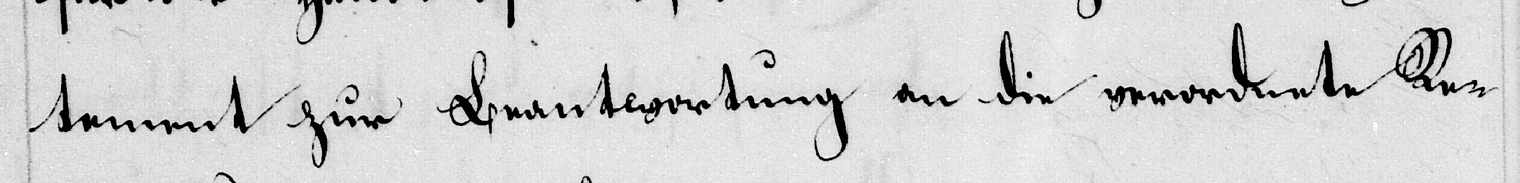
tement zur Beantwortung an die verordnete Re¬
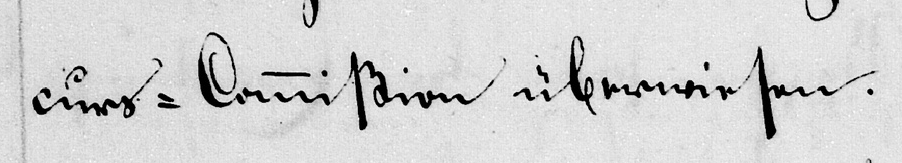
curs-Commißion überwiesen.
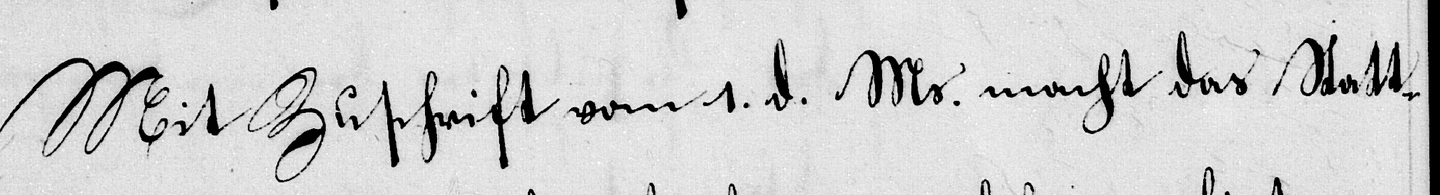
Mit Zuschrift vom 1. d. Ms. macht das Statt¬
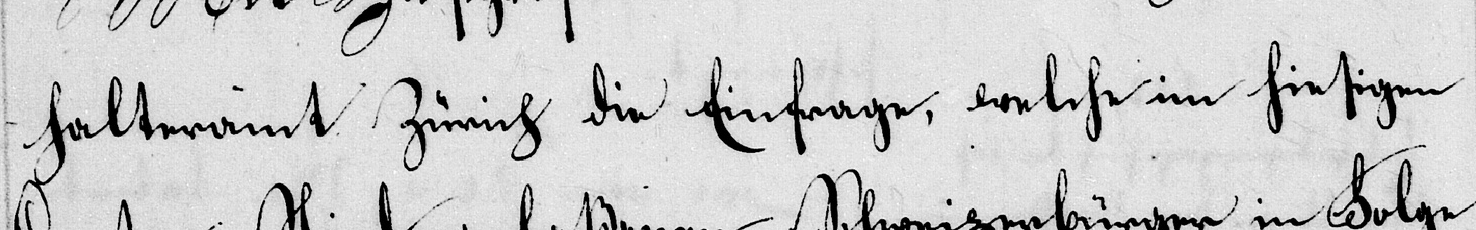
halteramt Zürich die Einfrage, welche im hiesigen
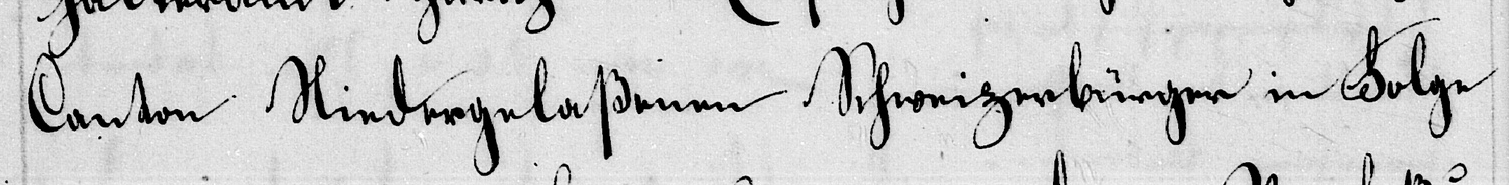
Canton Niedergelaßenen Schweizerbürger in Folge
